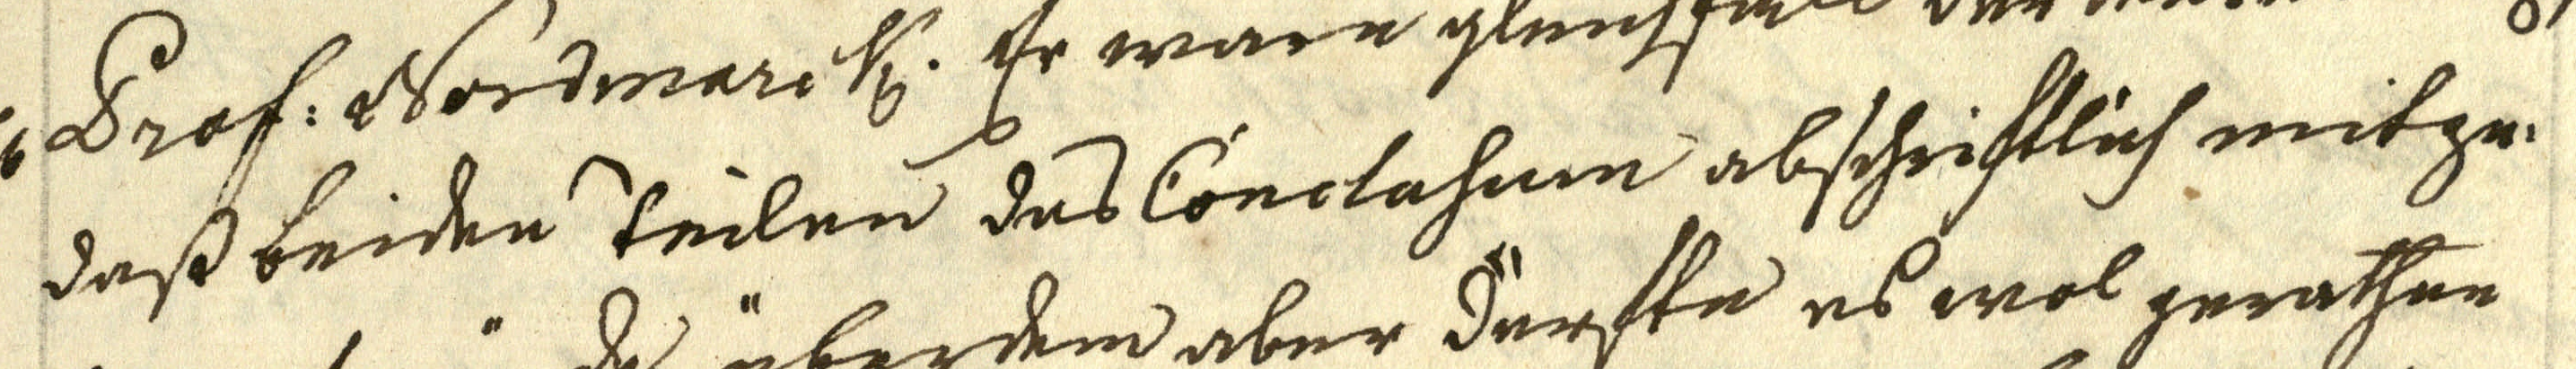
daß beiden Teilen das Conclusum abschriftlich mit¬
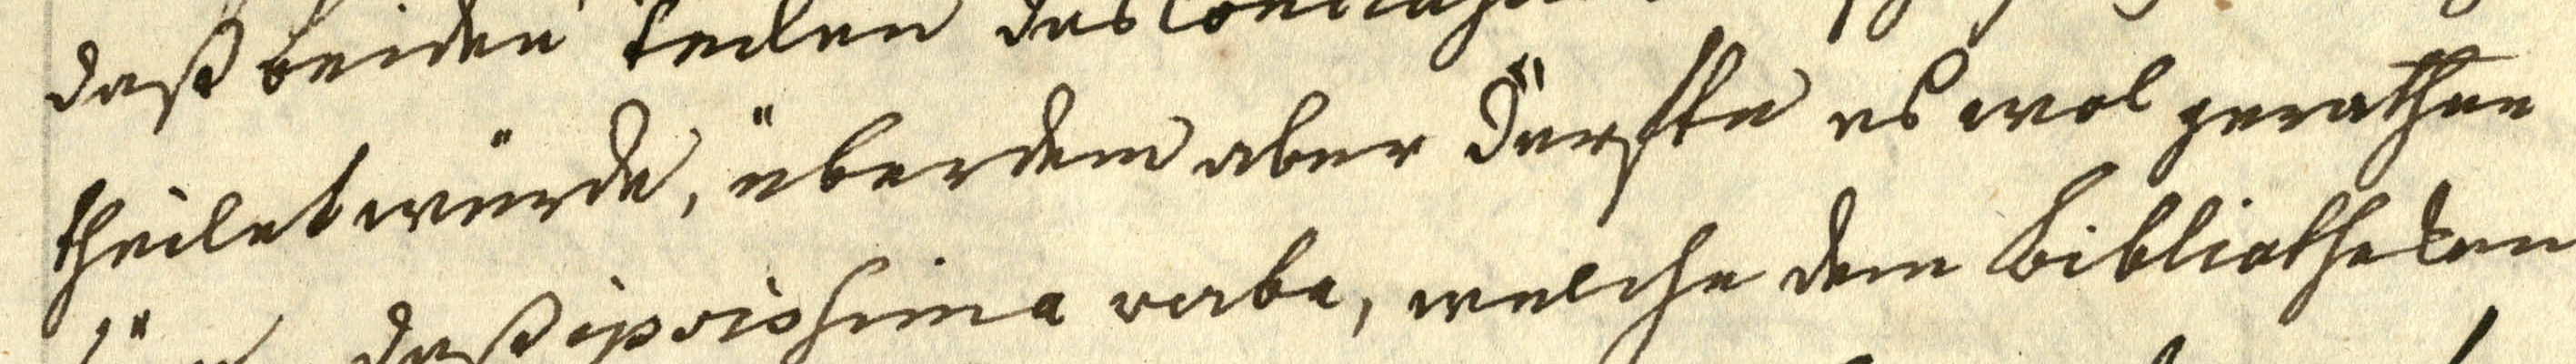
theilet würde, überdem aber dürfte es wohl gerathen
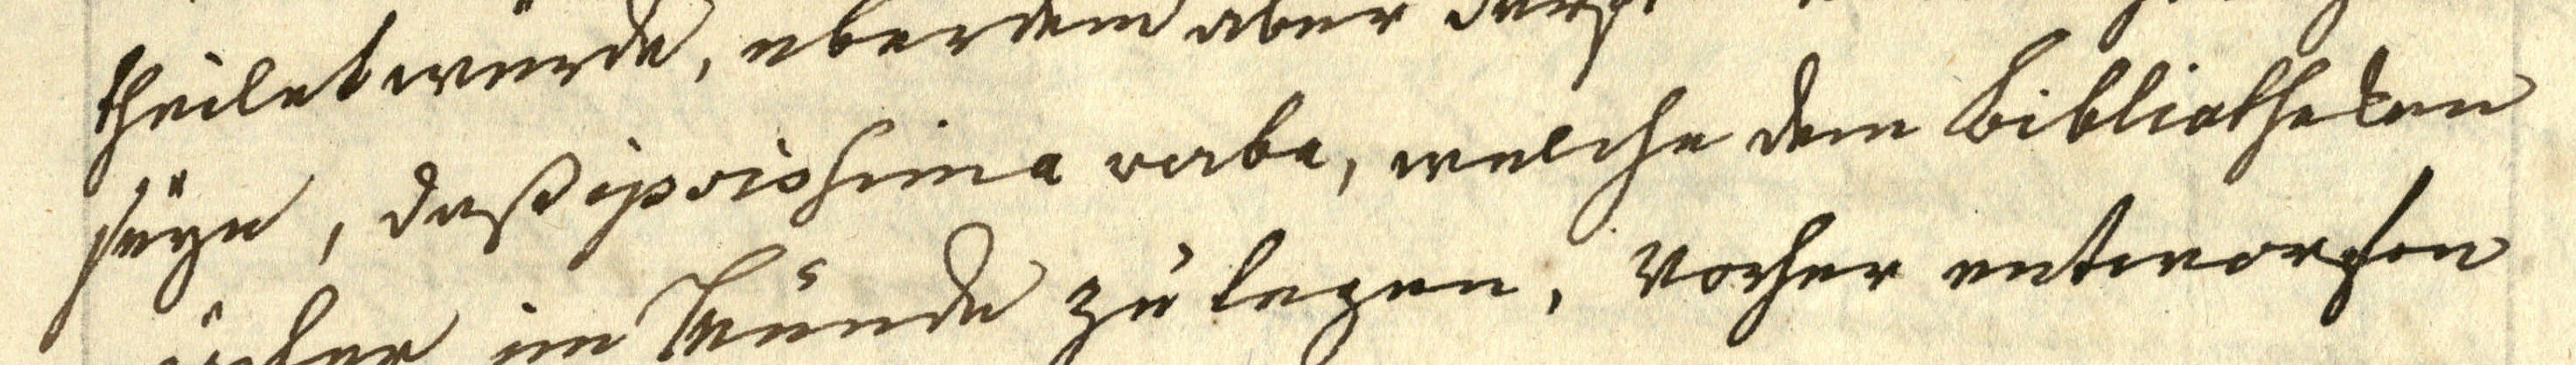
seÿn, daß ipsissima verba, welche dem Bibliotheken¬
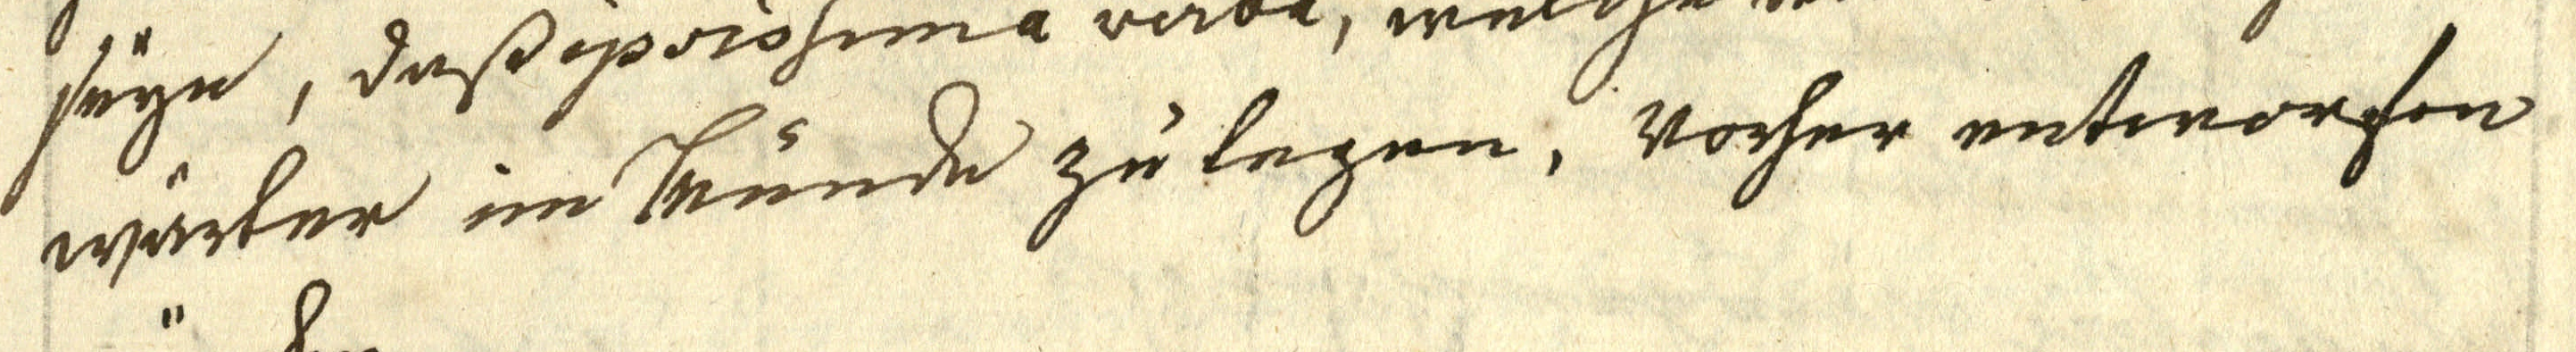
wärter im Munde zu legen, vorher entworfen
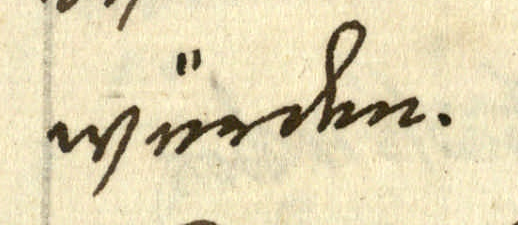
würden.
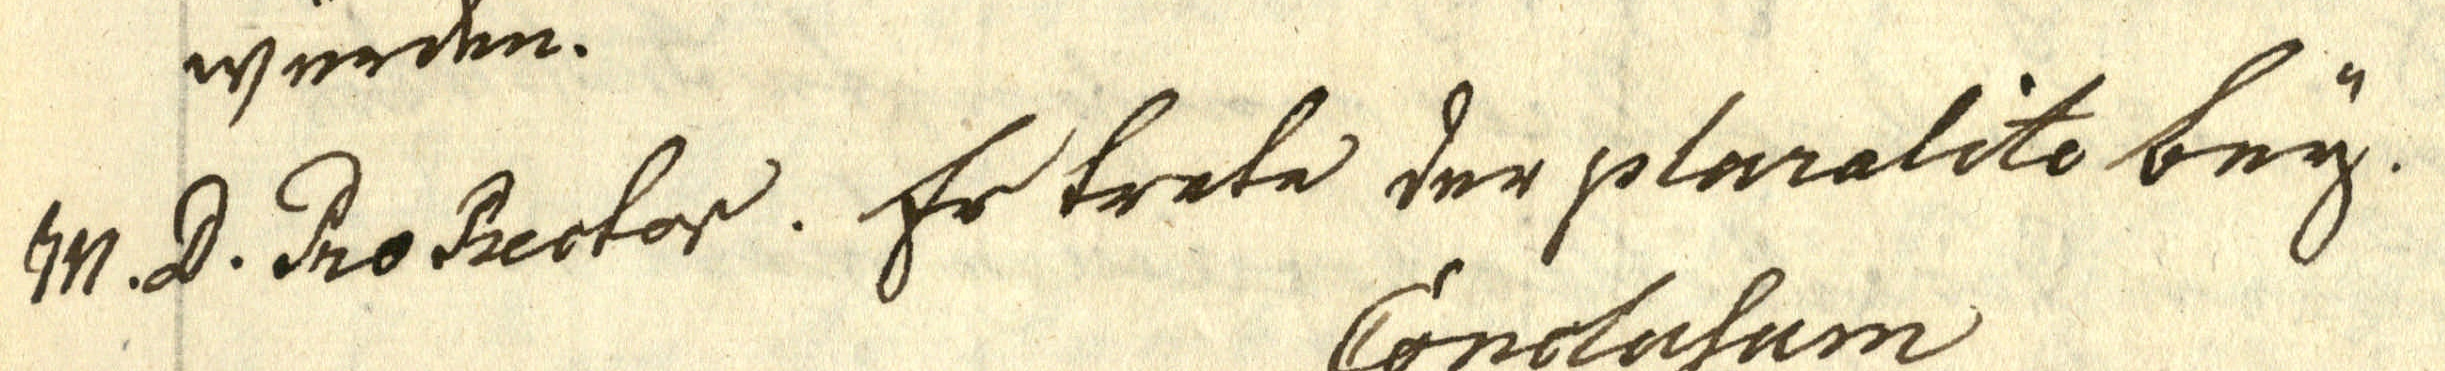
M. D. der Rector. Er trete der pluralite beÿ.
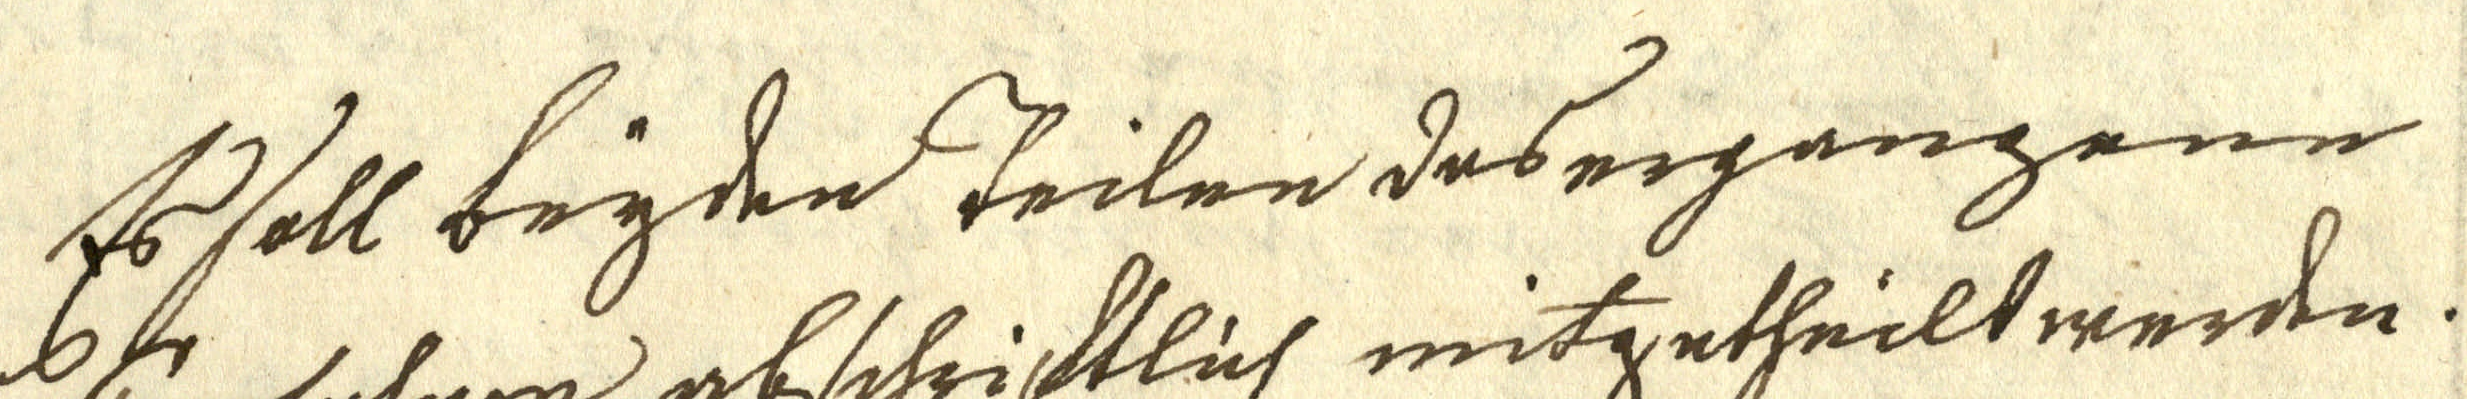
Es soll beÿden Teilen das ergangene
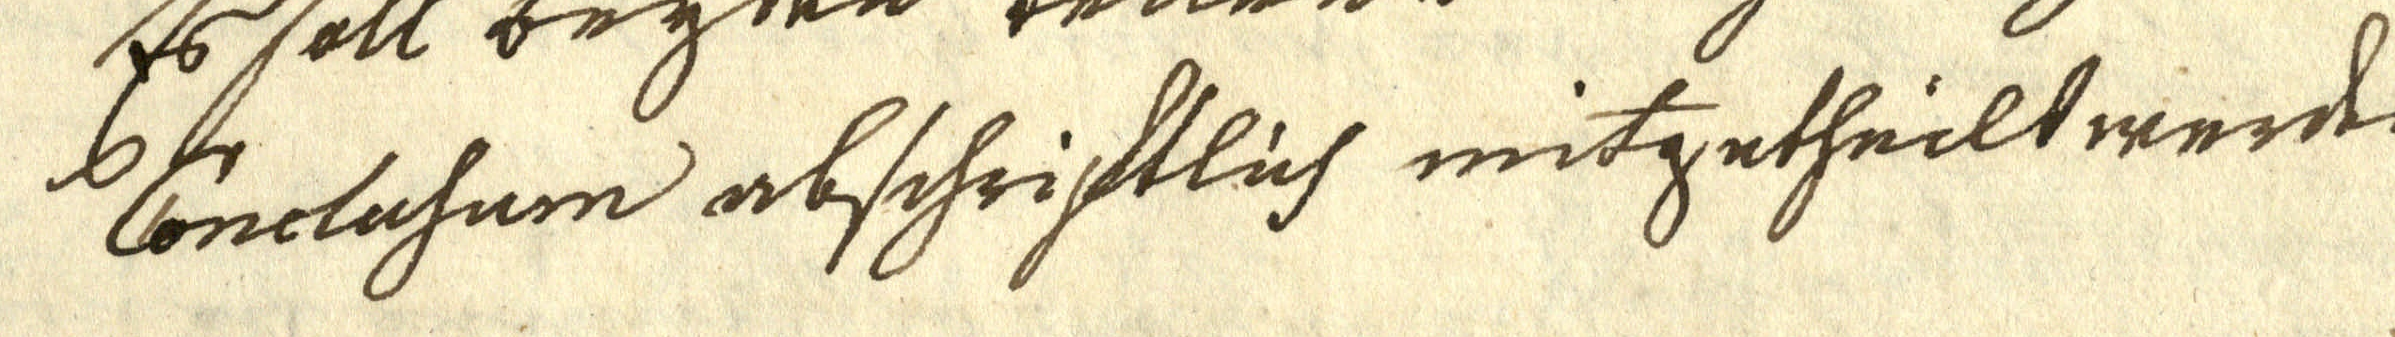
Conclusum abschriftlich mitgetheilt werden.
